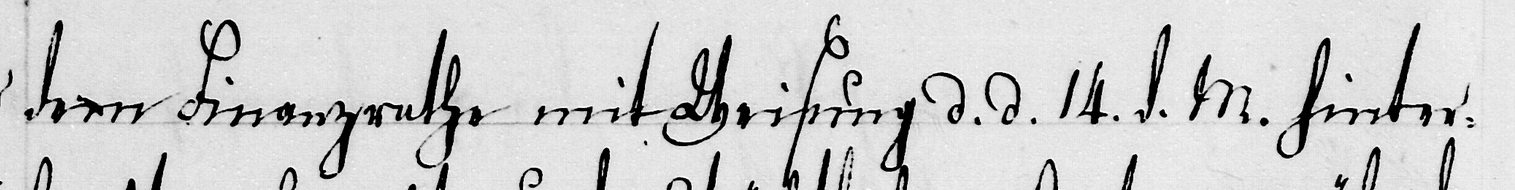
dem Finanzrathe mit Weisung d. d. 14. d. M. hinter¬
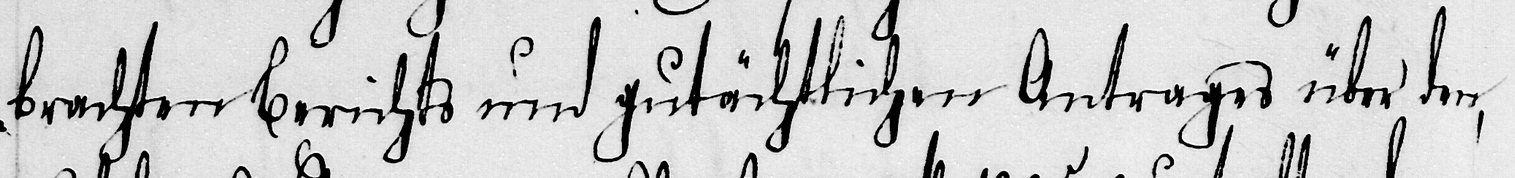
brachten Berichts und gutächtlichen Antrages über den,
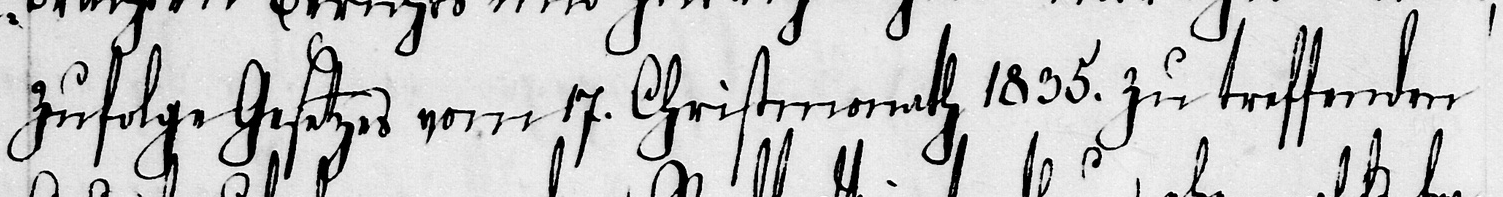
zufolge Gesetzes vom 17. Christmonath 1835. zu treffenden
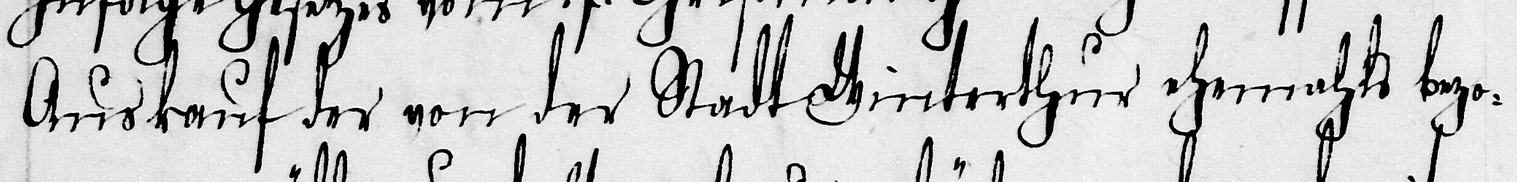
Auskauf der von der Stadt Winterthur ehemahls bez¬
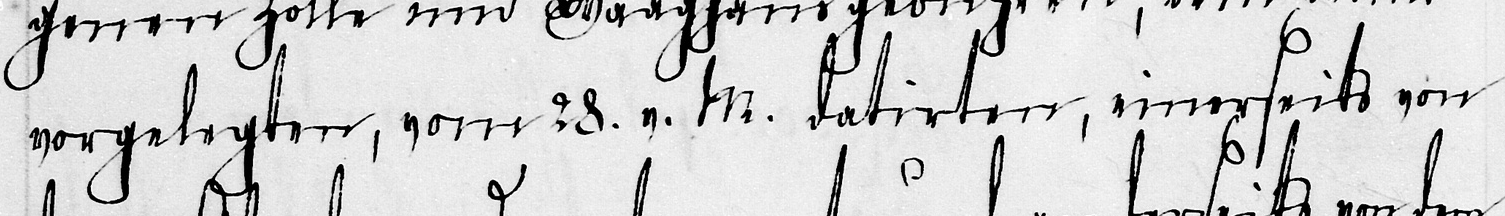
vorgelegten, vom 28. v. M. datirten, einerseits von
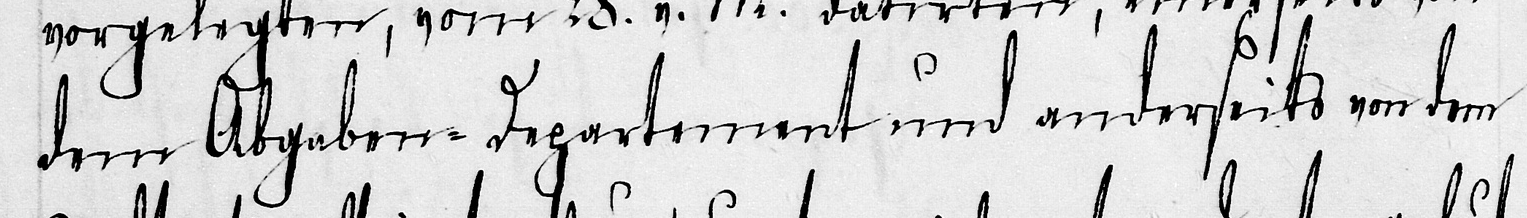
dem Abgaben-Departement und anderseits von dem
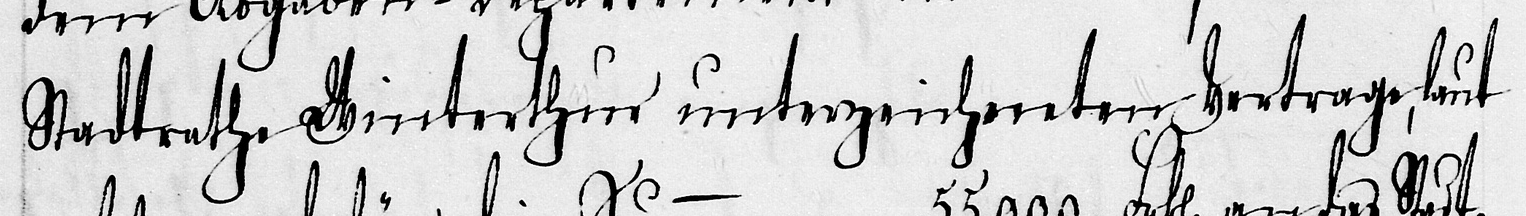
Stadtrathe Winterthur unterzeichneten Vertrage, laut
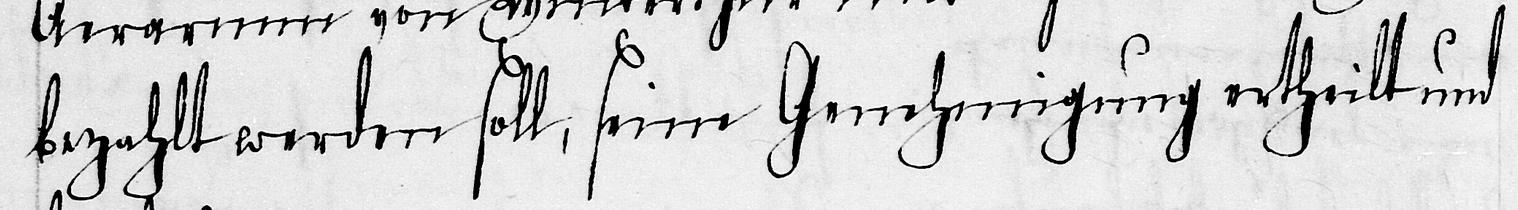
bezahlt werden soll, seine Genehmigung ertheilt und
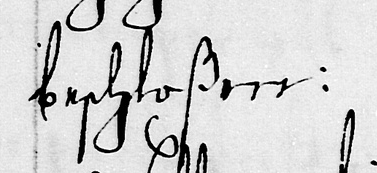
beschloßen:
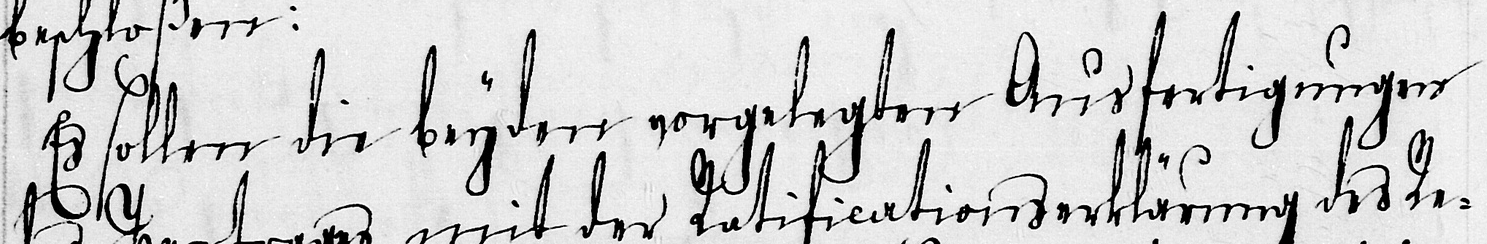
Es sollen die beyden vorgelegten Ausfertigungen
